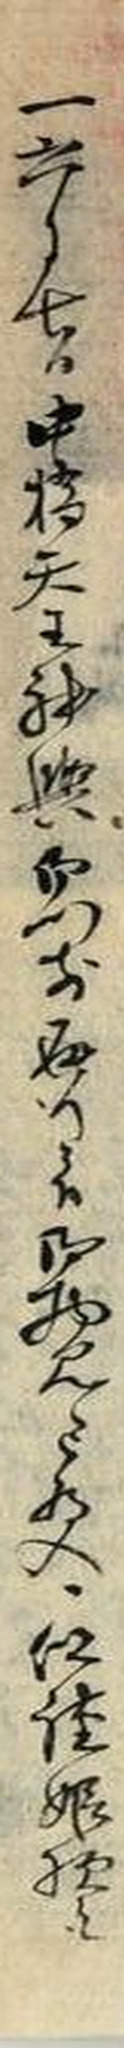一六月七日中橋天王神輿御門前通行ニ付御物見へ被為入候但謹姫様二も

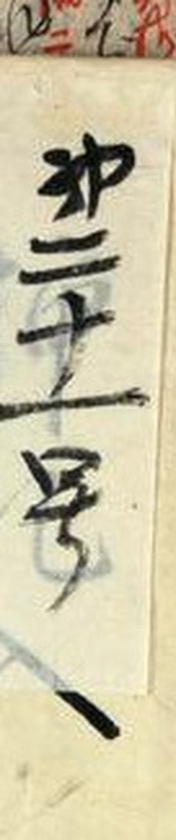第二十一号
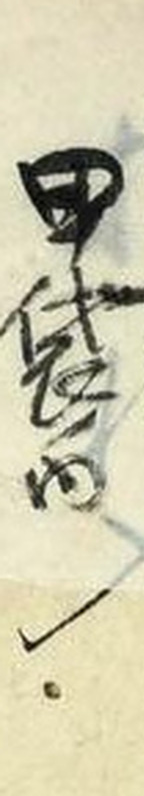甲袋内

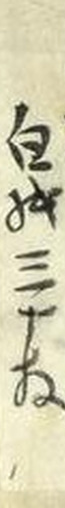白紙三十枚

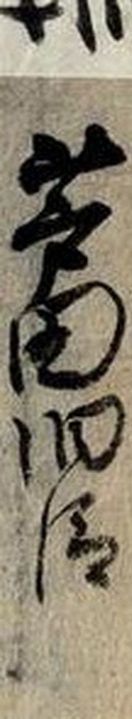芦田旧臣
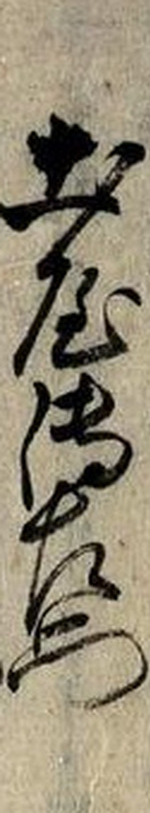土屋伝左衛門
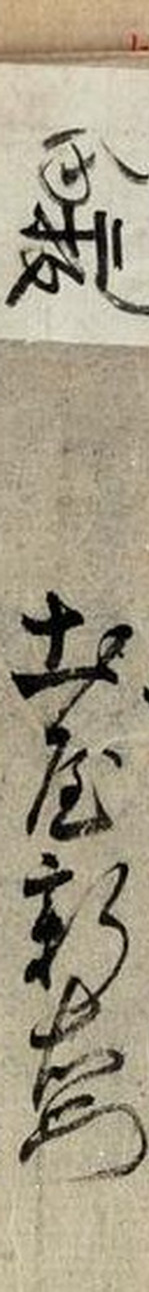土屋新右衛門
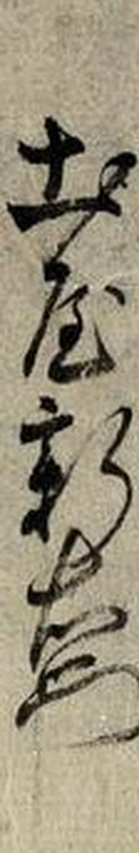土屋新右衛門
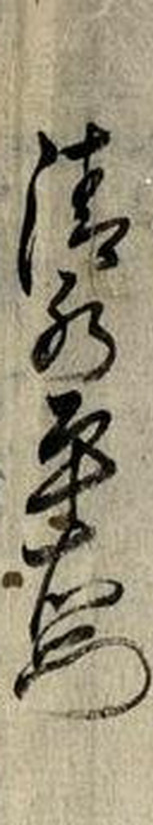清水平右衛門
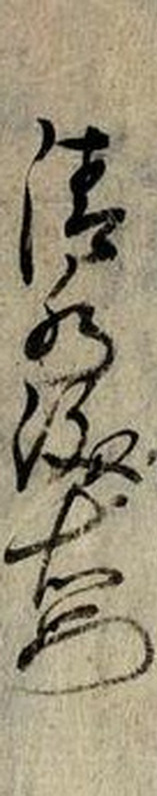清水儀右衛門
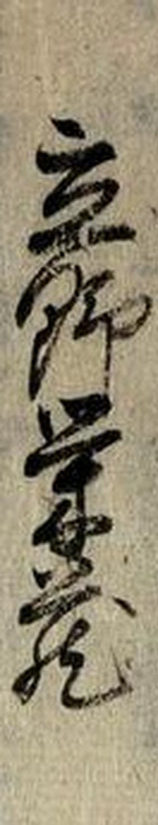立野栄蔵
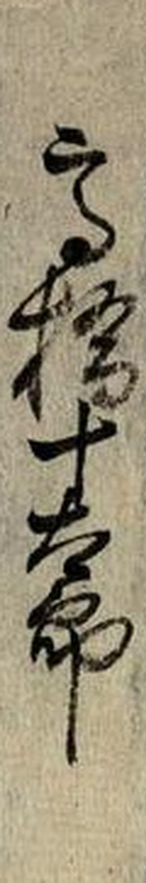高橋十太郎
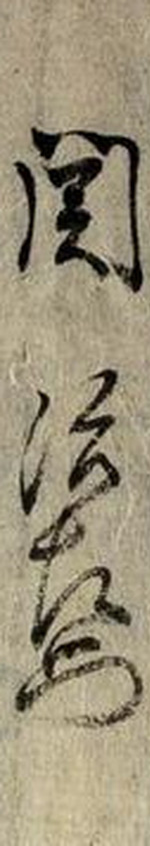関治左衛門
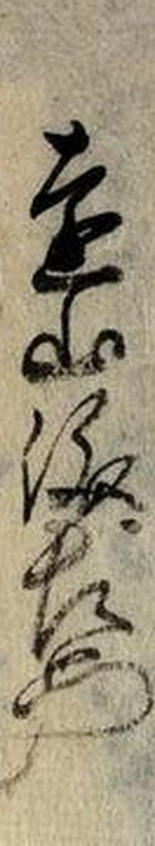遠山儀左衛門
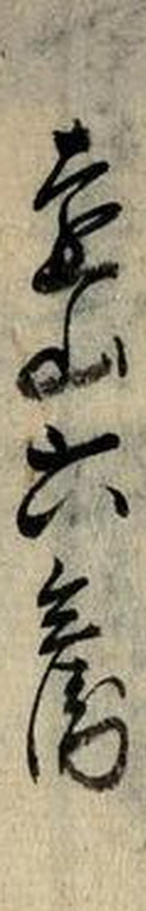遠山六兵衛
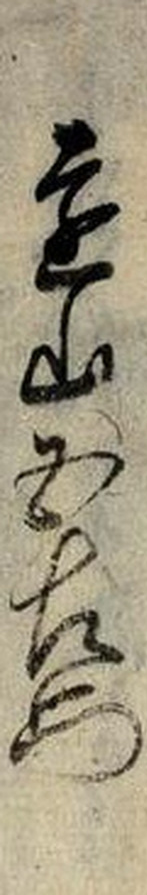遠山五左衛門
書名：少傅日録抄（斉承付側向頭取日記、在府）
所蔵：福井県文書館 Fukui Prefectural Archives
